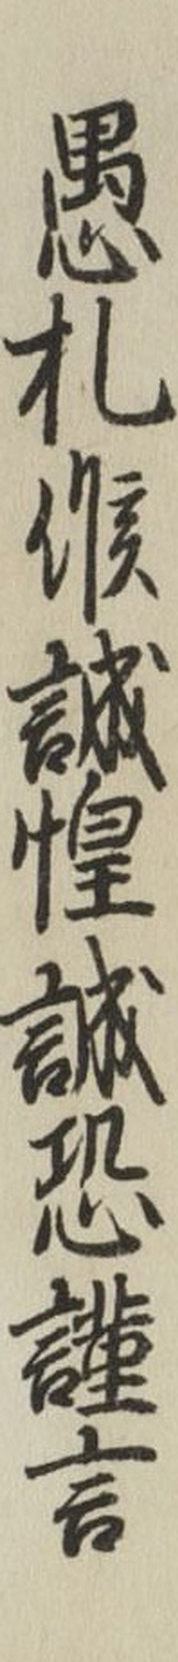愚札候誠惶誠恐謹言
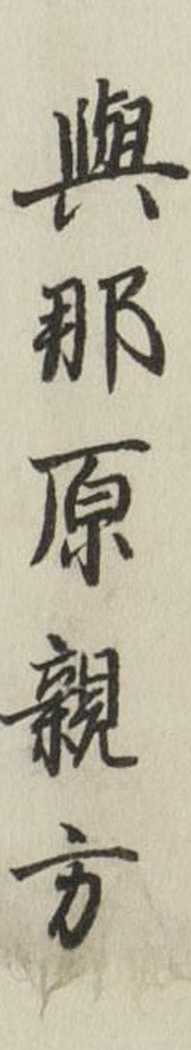與那原親方
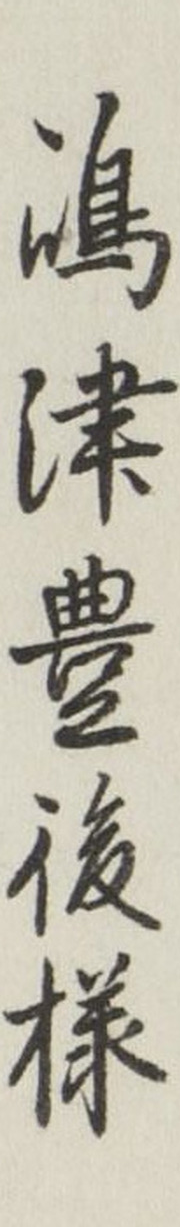嶋津豊後様
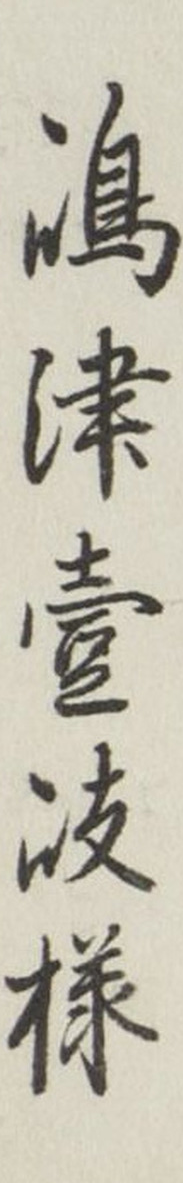嶋津壱岐様
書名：島津家宛花押印状(三) 與那原親方 良綱
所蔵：University of the Ryukyus Library
